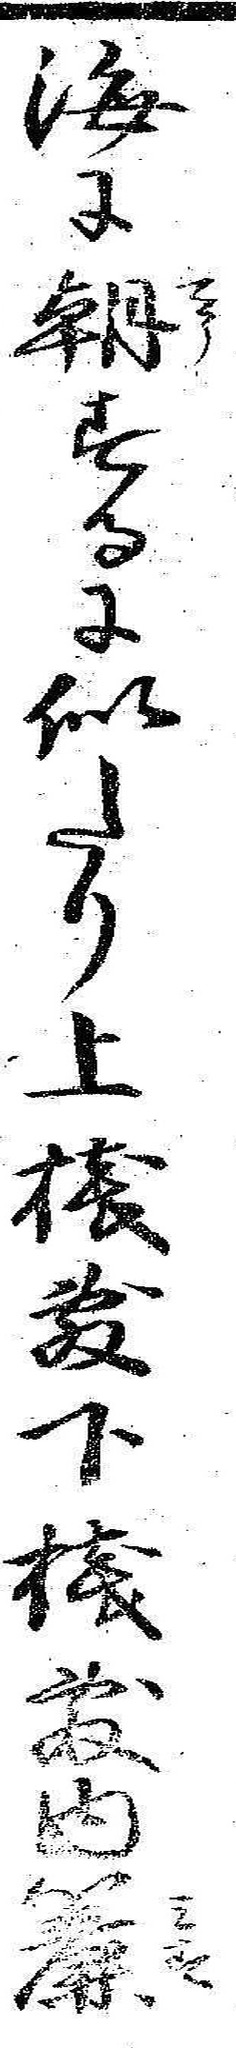海に朝するに似たり上桟敷下桟敷内簾
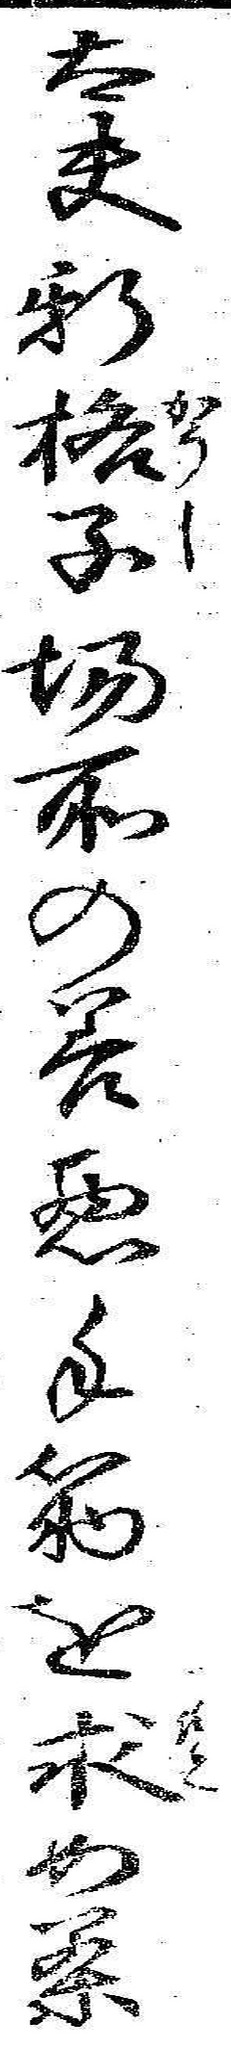太夫新格子場所の善悪手筋を求め茶
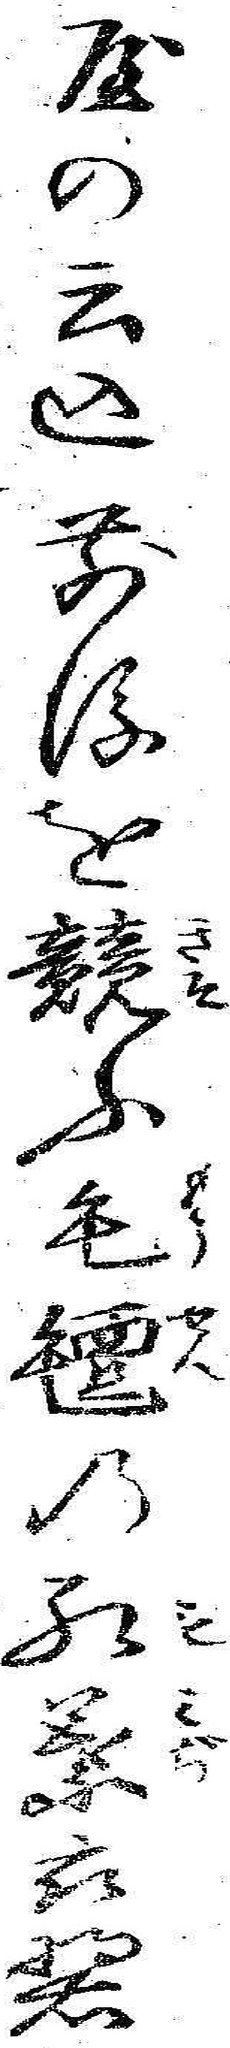屋の云込前後を競ふ毛氈の紅葉衣装
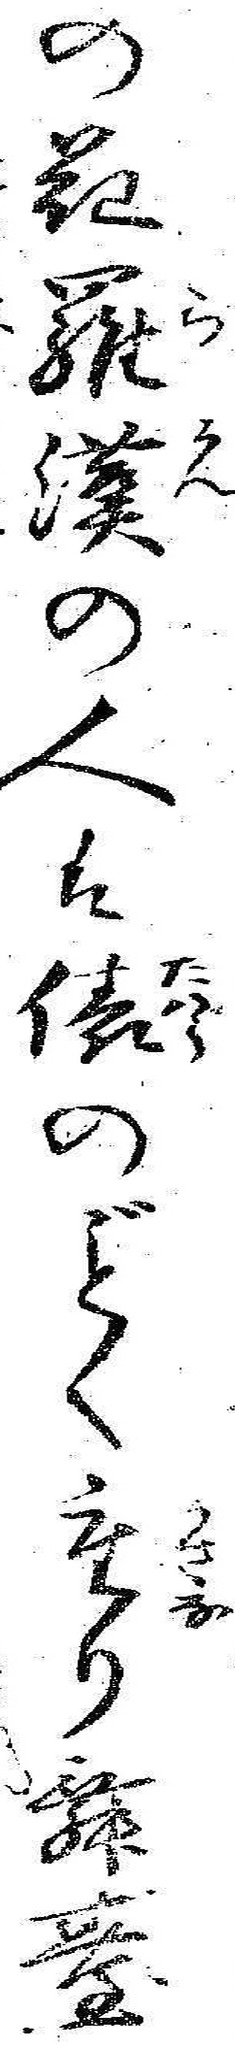の花羅漢の人は俵のごとく重り舞台
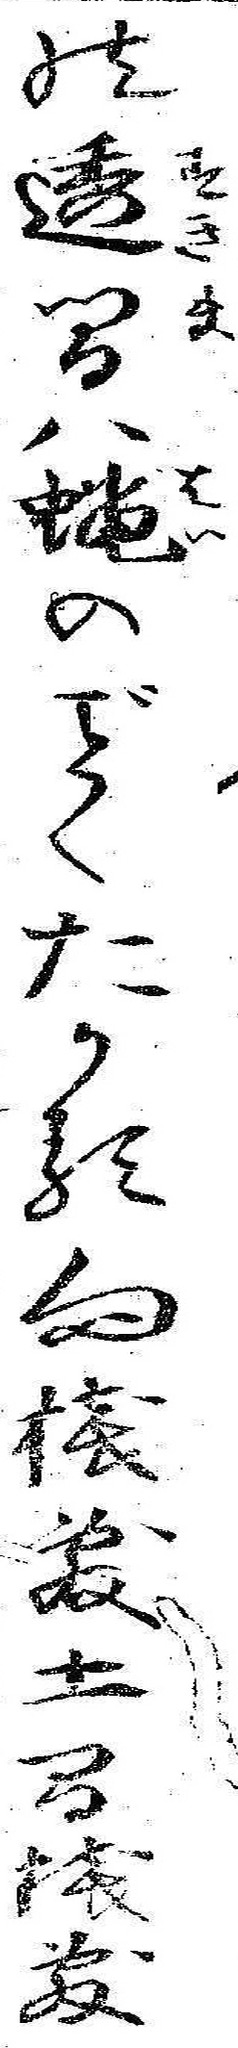の透間は蝿のごとくたかる向桟敷土間桟敷
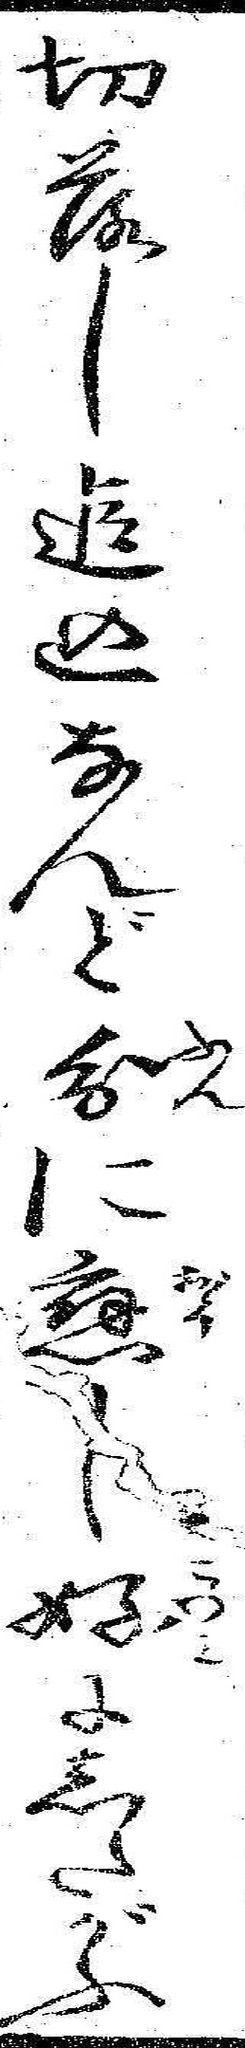切落し追込なんど分に応し好にしたがふ
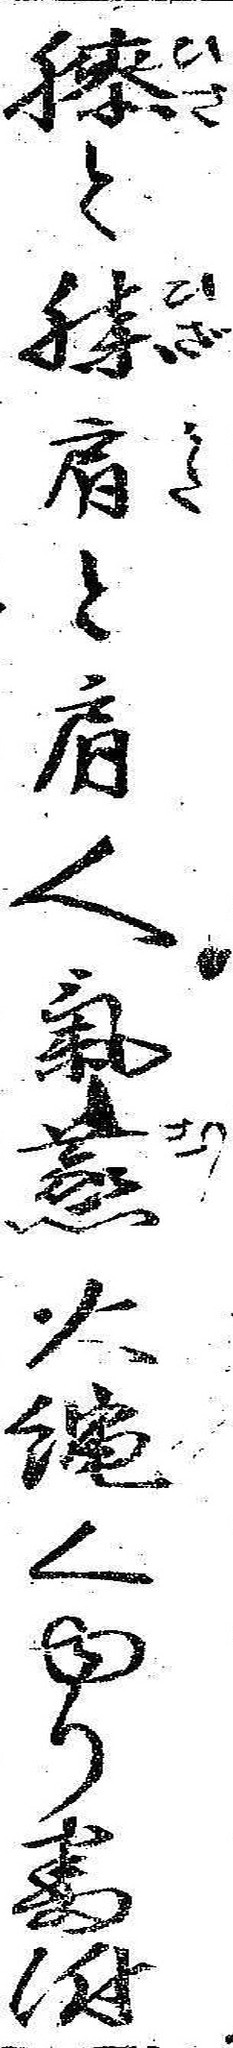膝と膝肩と肩人気蒸火縄くゆり番附
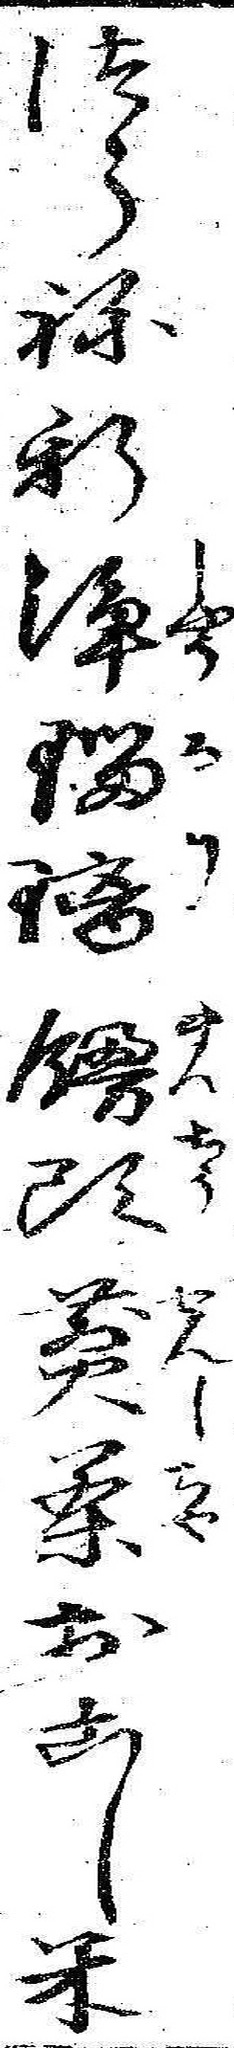つらね新浄瑠璃饅頭煎茶おこし米
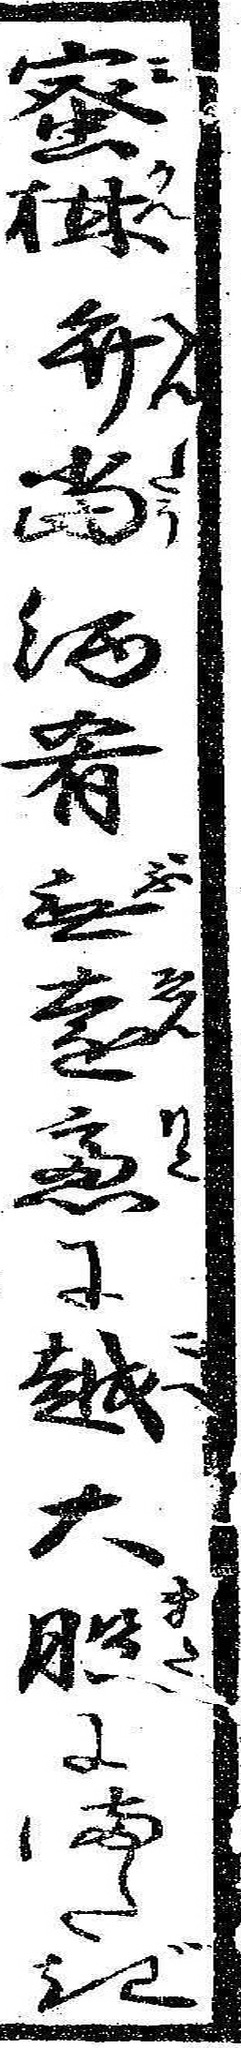蜜柑弁当酒肴無遠慮に越大股にまたぎ
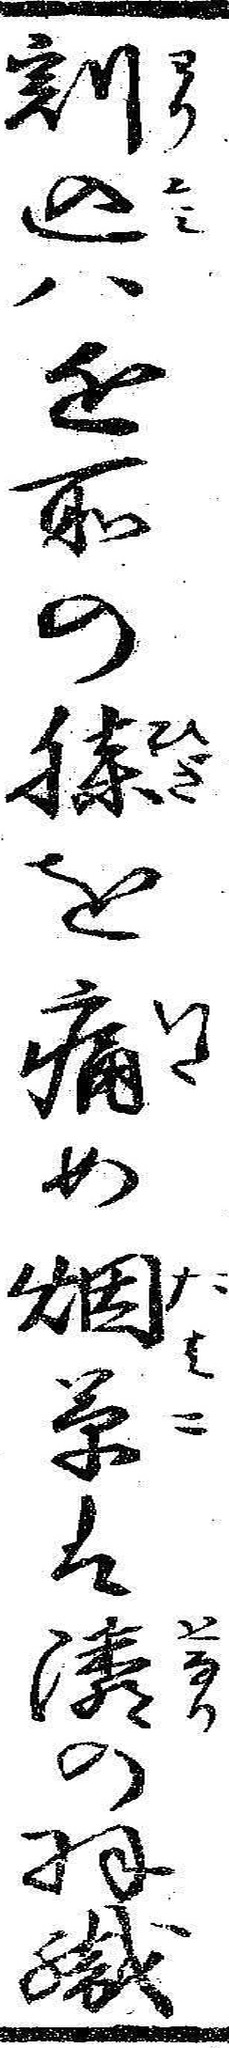割込は近所の膝を痛め烟草は隣の羽織
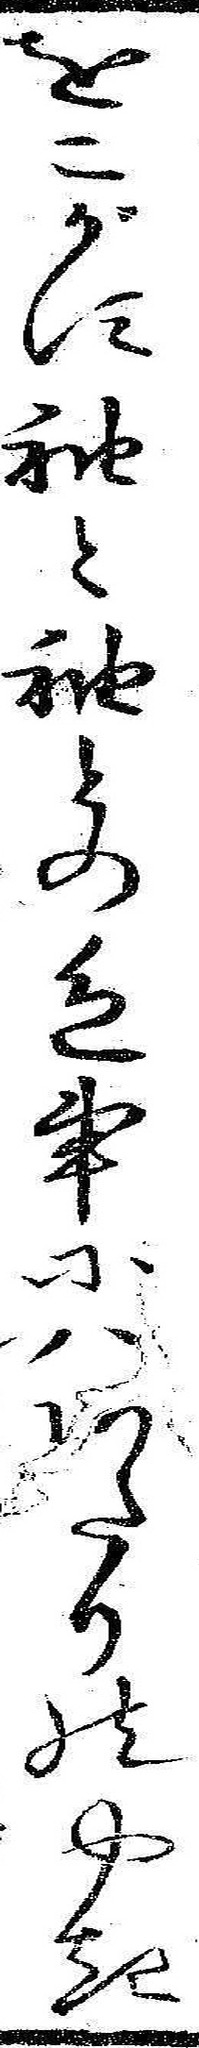をこがす袖と袖との色事にはつたりのやき
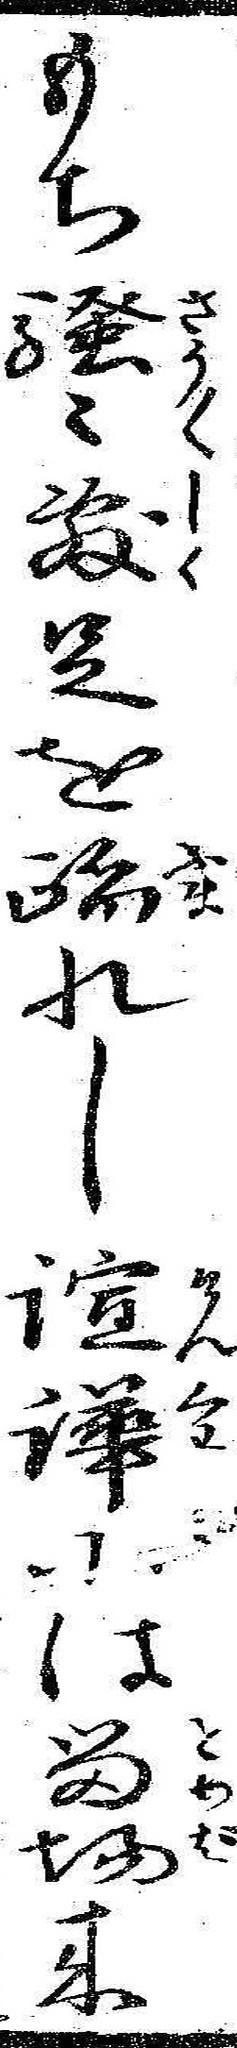もち騒々敷足を踏れし諠譁には留場来
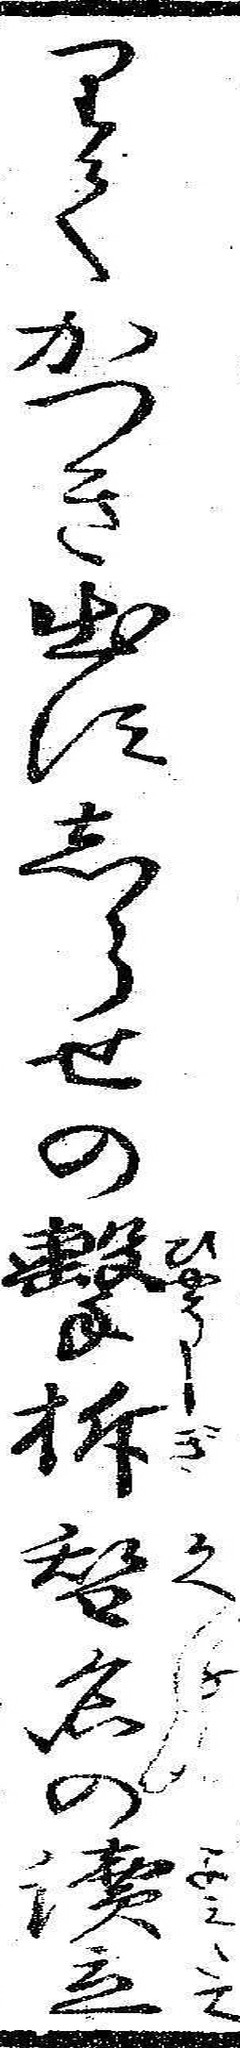りてかつき出すしらせの撃拆替名の読立
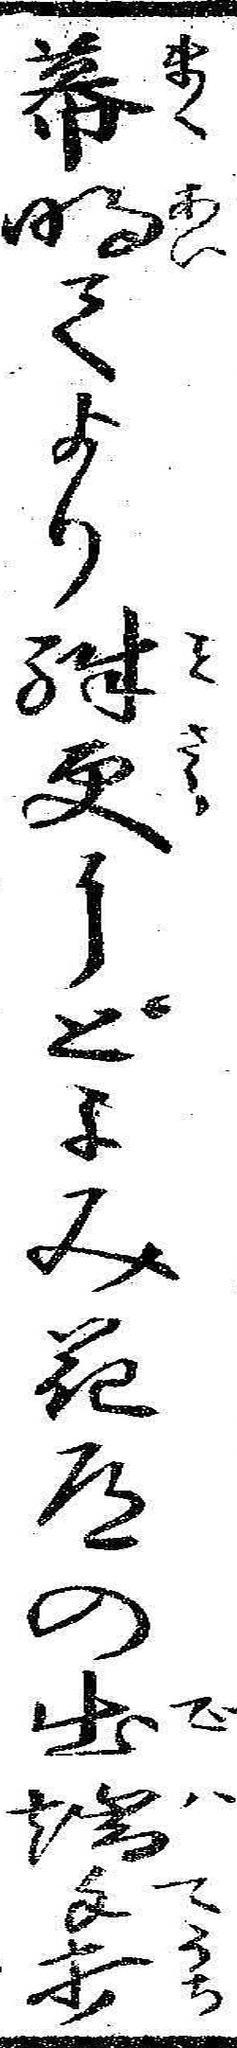幕明てより殊更にどよみ花道の出端手打
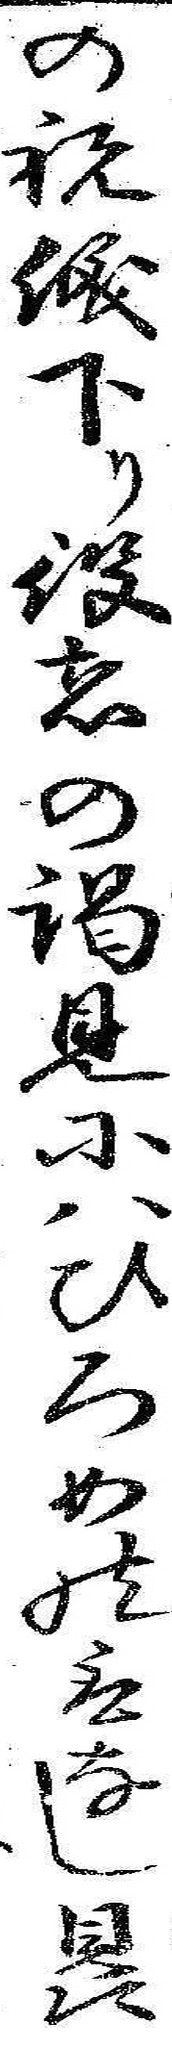の祝儀下役者の謁見にはひろめの取なし贔
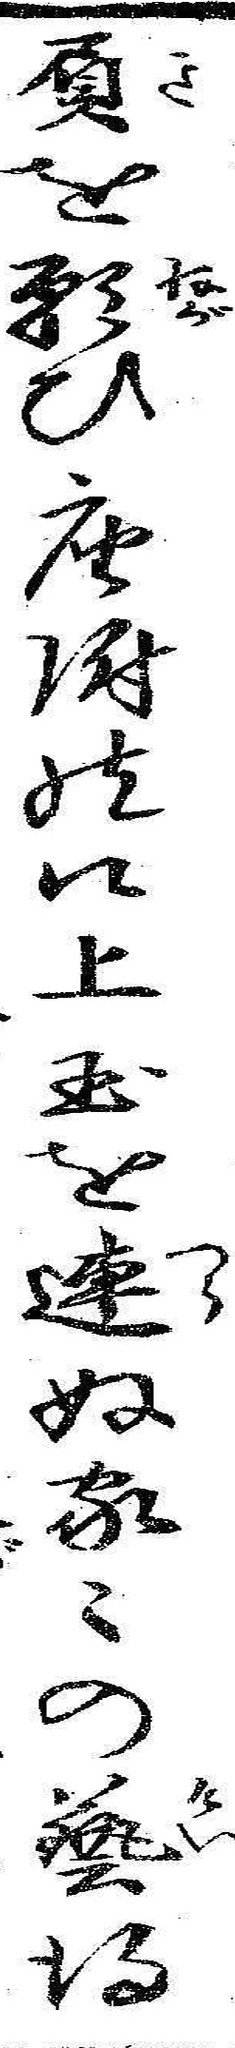屓を願ひ座附の口上玉を連ぬ家々の芸得
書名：根無草後編
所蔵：国文学研究資料館
